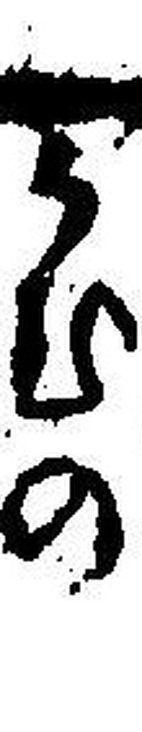うむの
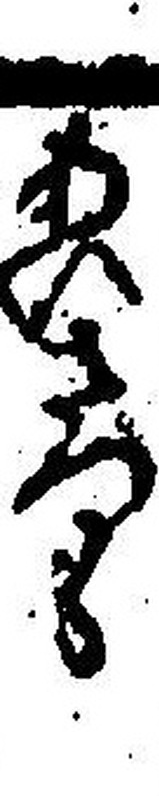あいさつも
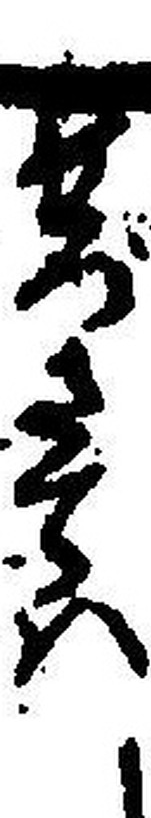せづさては
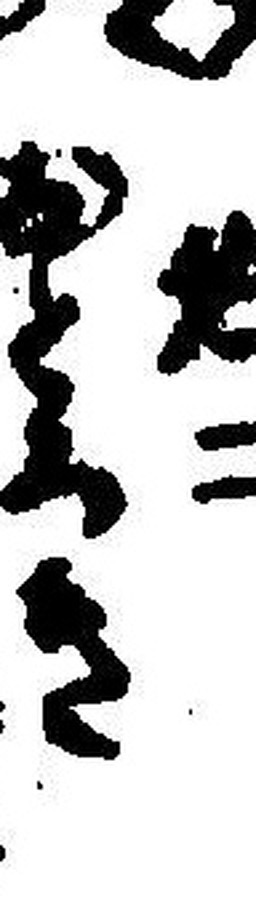おとろき
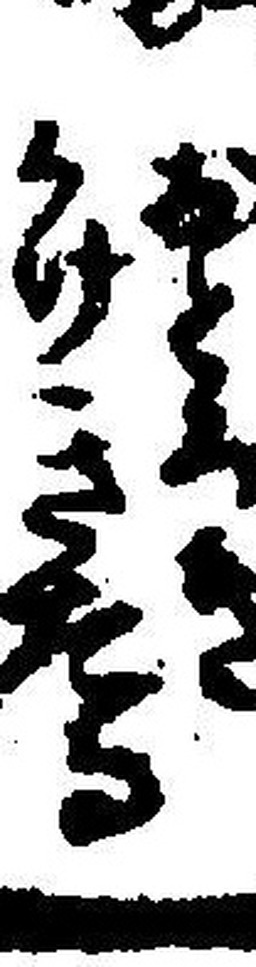かけきたる
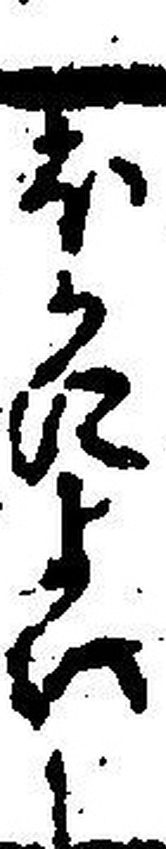ほかによい
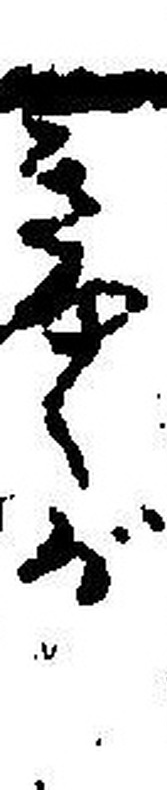きやくが
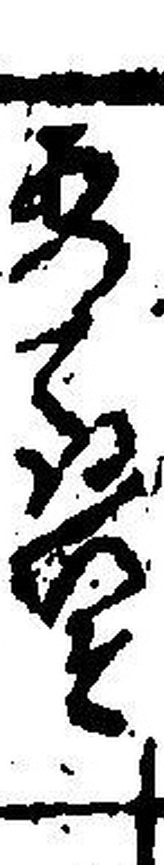あつてあいそ
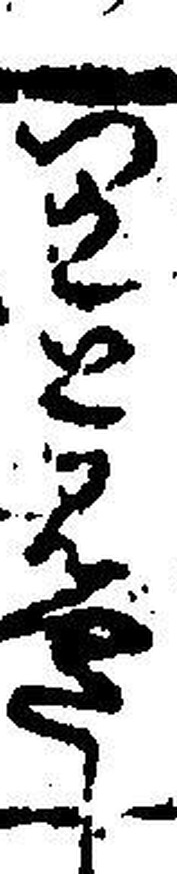つかしとみへた
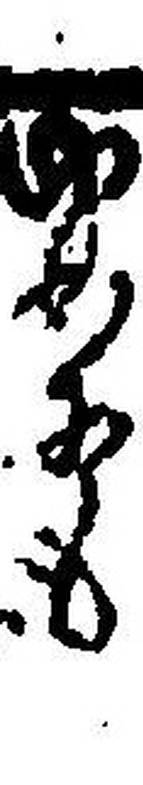ゆめにも
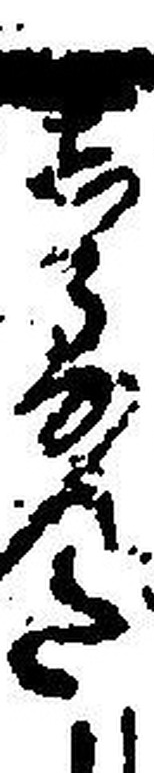しらなんだ
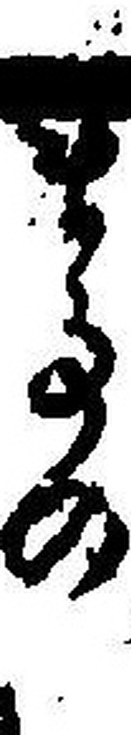ま事の

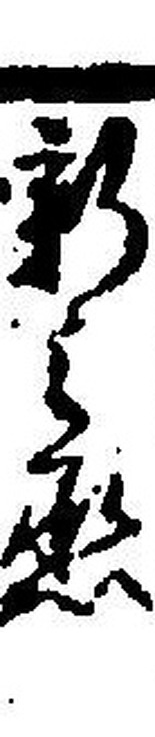新之丞
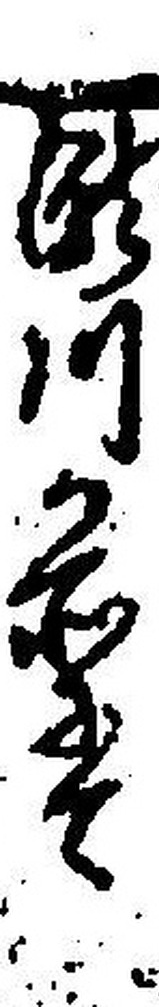滝川の所にて
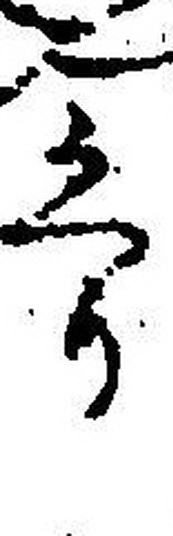かへり
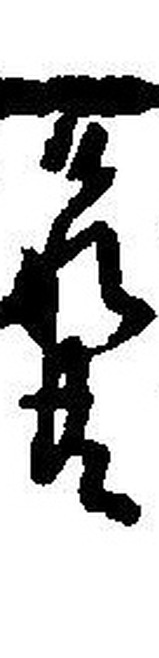けれ共
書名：御代参牛時詣 / 市場通笑作
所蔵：東京大学総合図書館 General Library in the University of Tokyo, JAPAN
